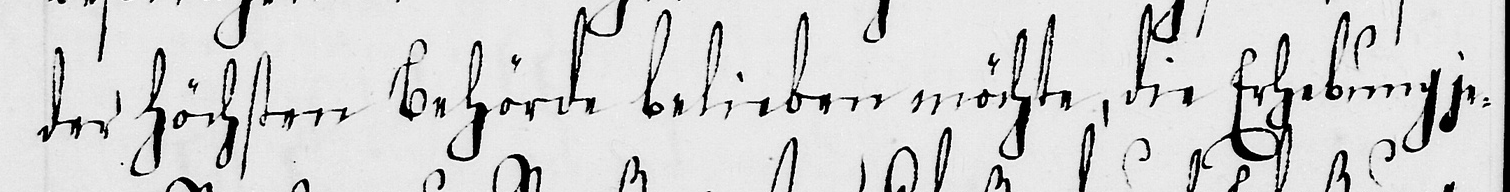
der Höchsten Behörde belieben möchte, die Erhebung j¬
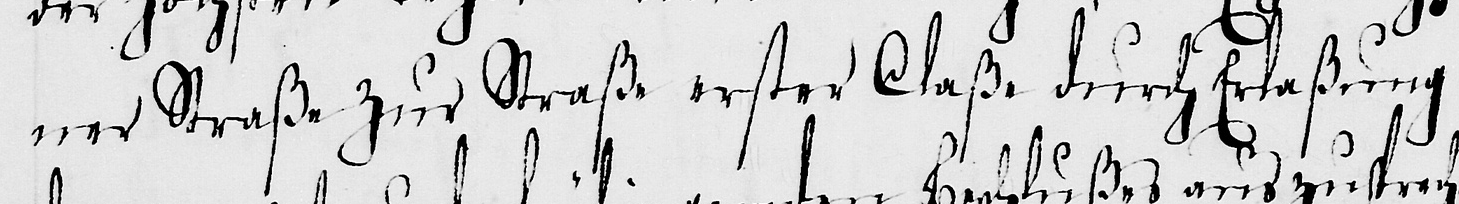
ener Straße zur Straße erster Claße durch Erlaßung
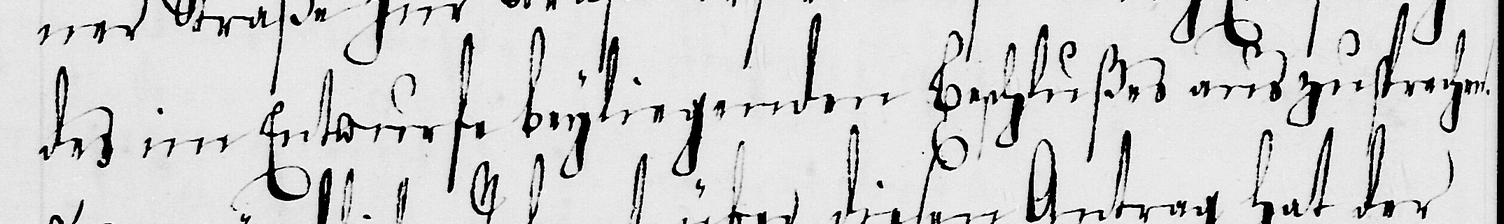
des im Entwurfe beyliegenden Beschlußes auszusprech¬
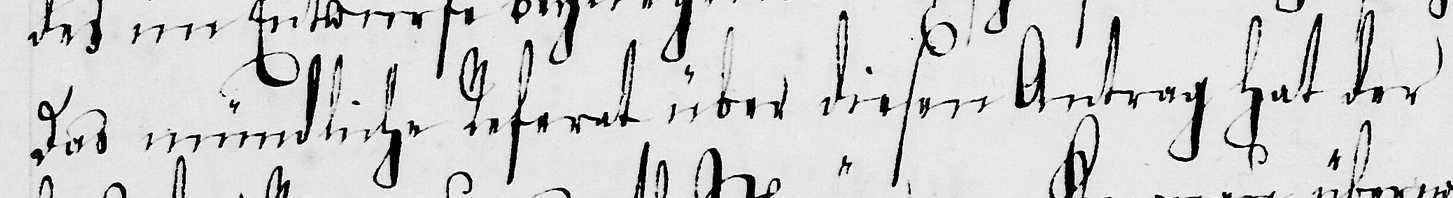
Das mündliche Referat über diesen Antrag hat der
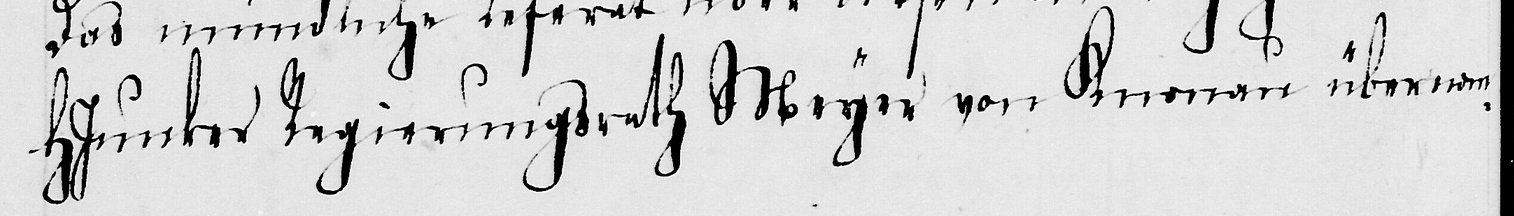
HJunker Regierungsrath Meyer von Knonau übernom¬
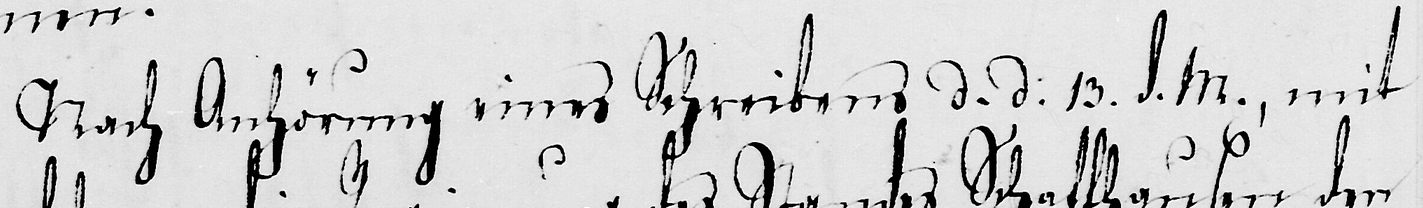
Nach Anhörung eines Schreibens d. d. 13. d. M., mit
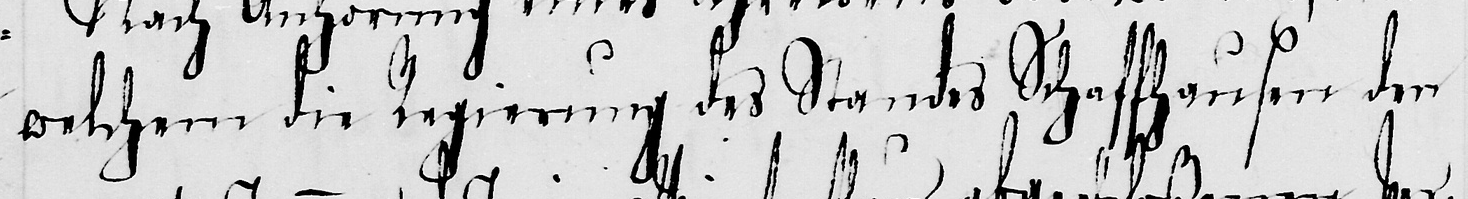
welchem die Regierung des Standes Schaffhausen den
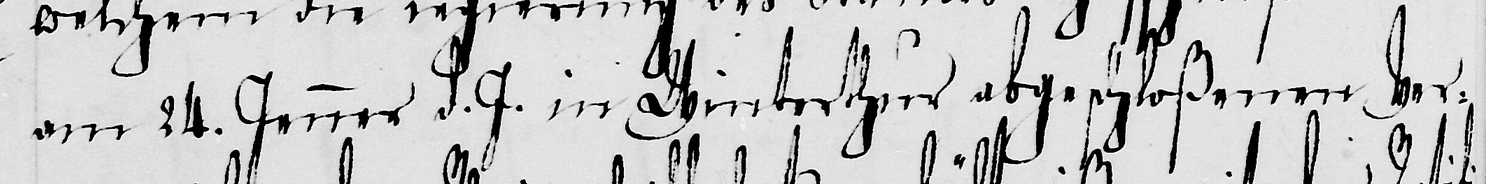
am 24. Jenner d. J. in Winterthur abgeschloßenen Ver¬
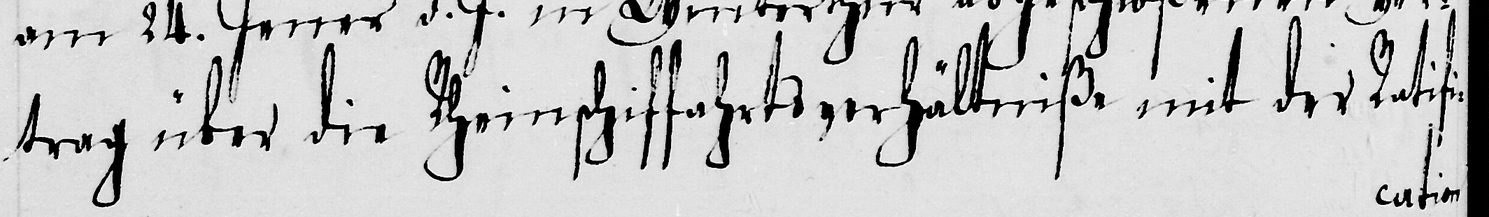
trag über die Rheinschiffahrtsverhältniße mit der Rati¬
